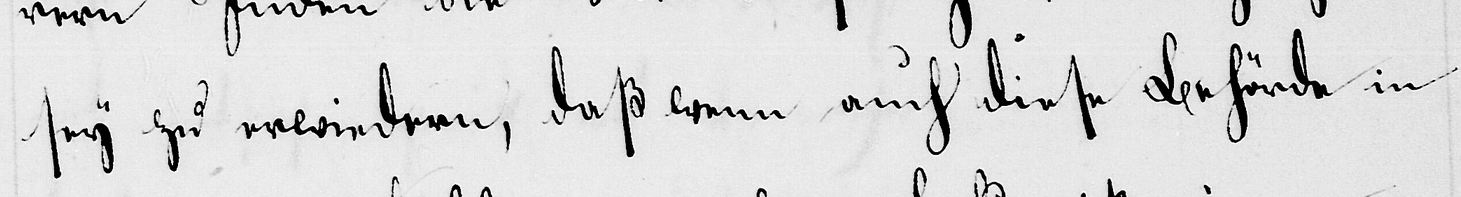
sey zu erwiedern, daß wenn auch diese Behörde in
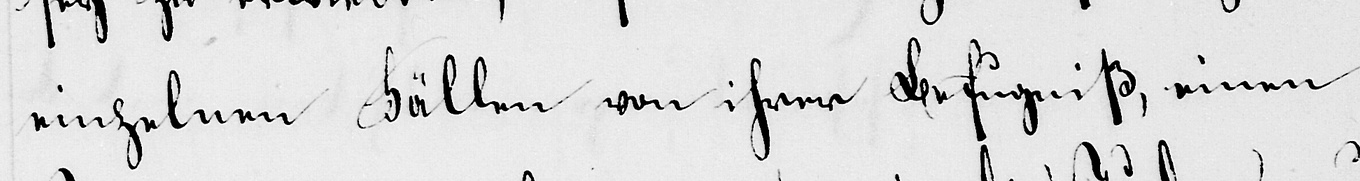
einzelnen Fällen von ihrer Befugniß, einen
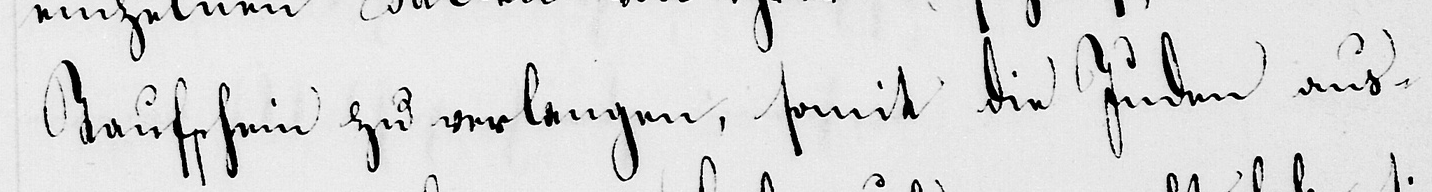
Taufschein zu verlangen, somit die Juden aus¬
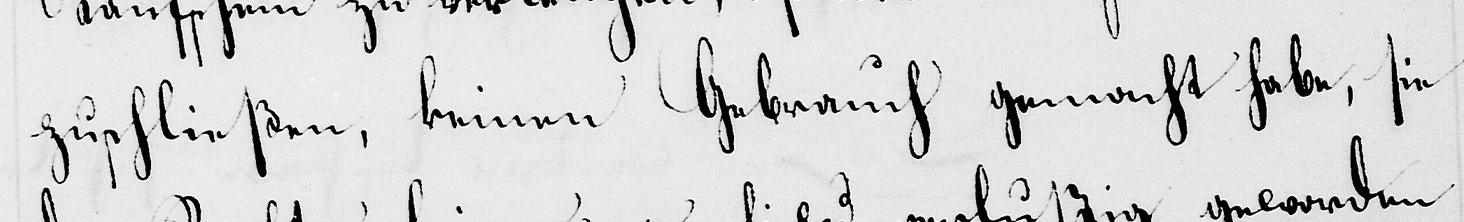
zuschließen, keinen Gebrauch gemacht habe, sie
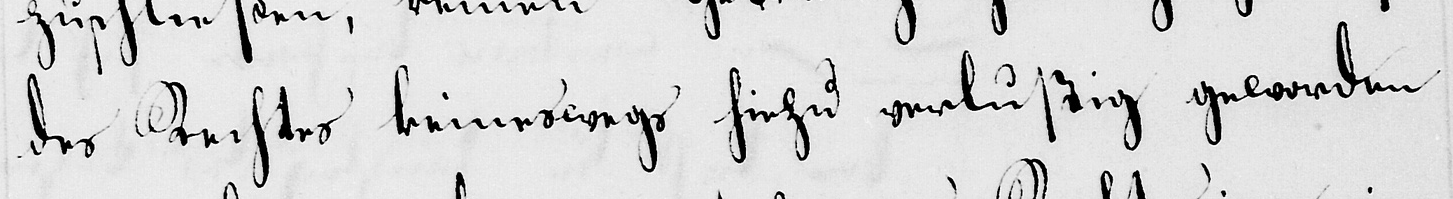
des Rechtes keineswegs hiezu verlustig geworden
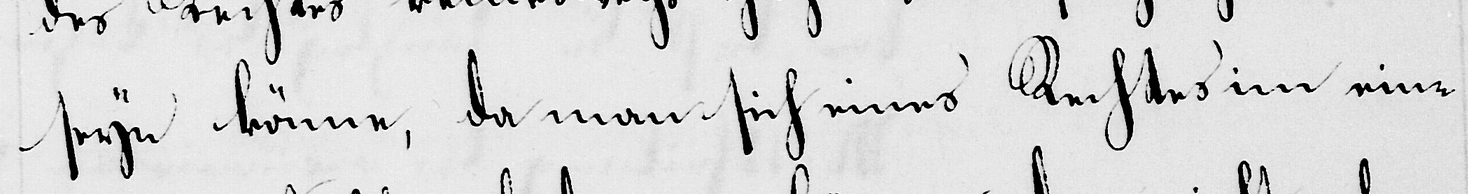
seyn könne, da man sich eines Rechtes im ein¬
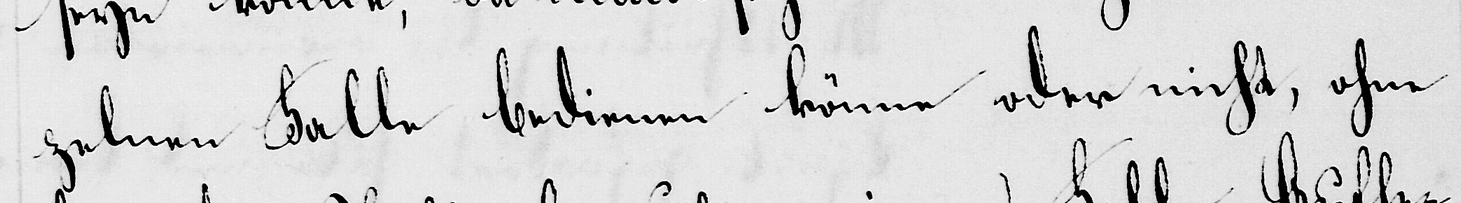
zelnen Falle bedienen könne oder nicht, ohne
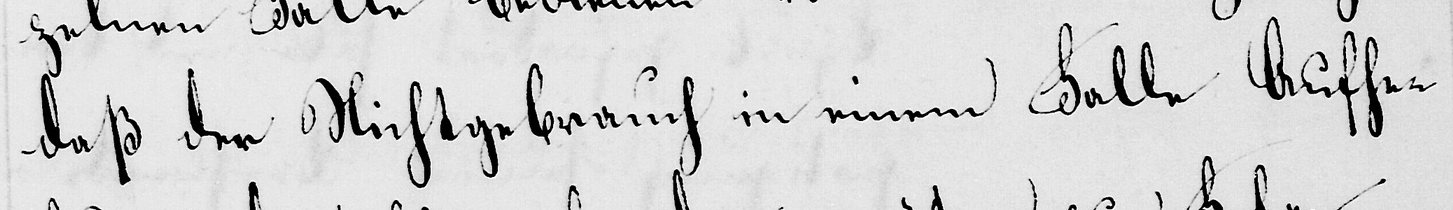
daß der Nichtgebrauch in einem Falle Aufhe¬
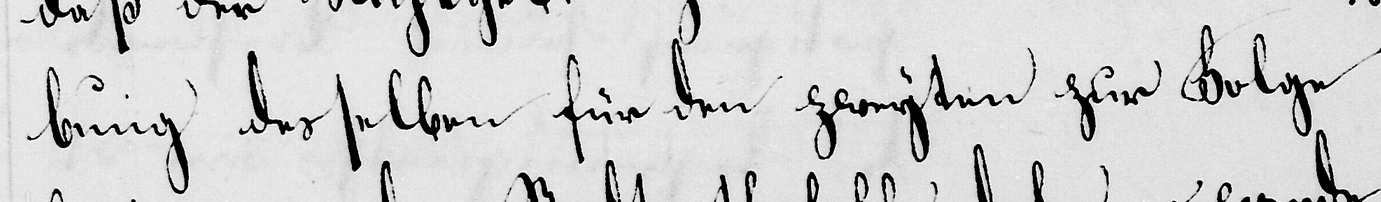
bung desselben für den zweyten zur Folge
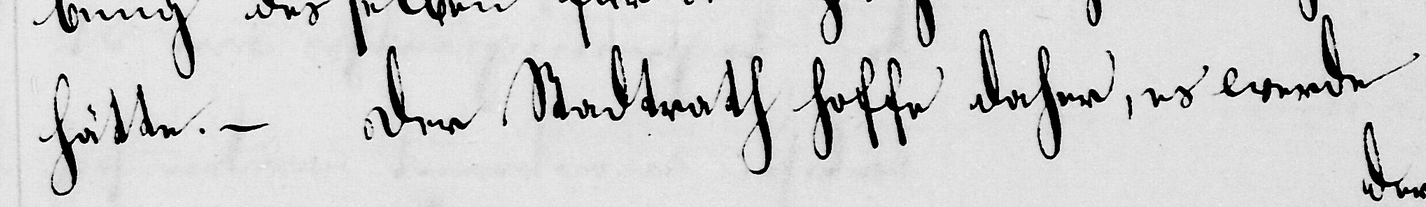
hätte. – Der Stadtrath hoffe daher, es werde
